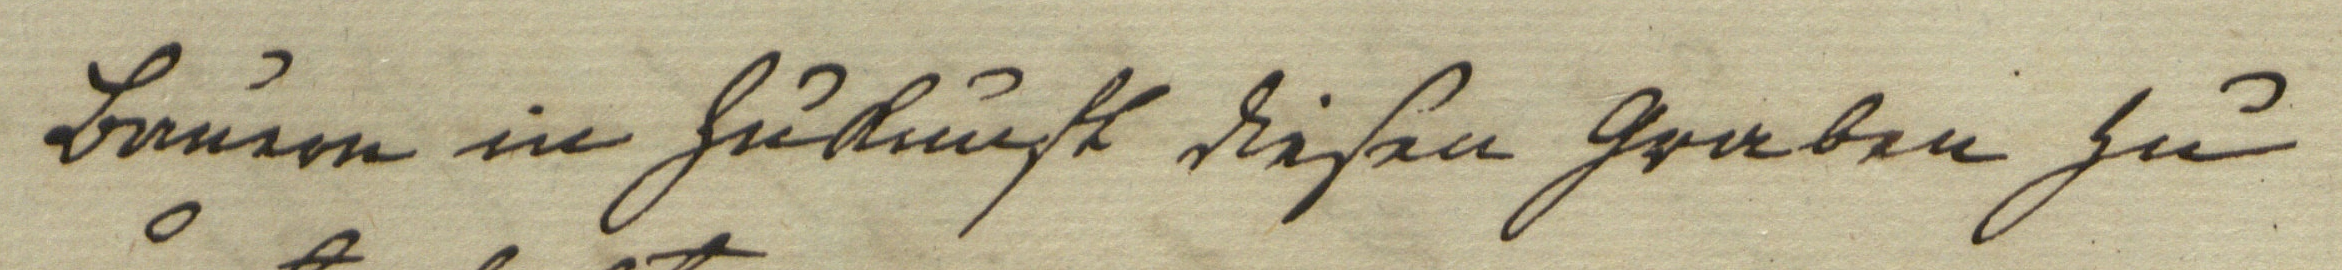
Bauern in Zukunft diesen Graben zu
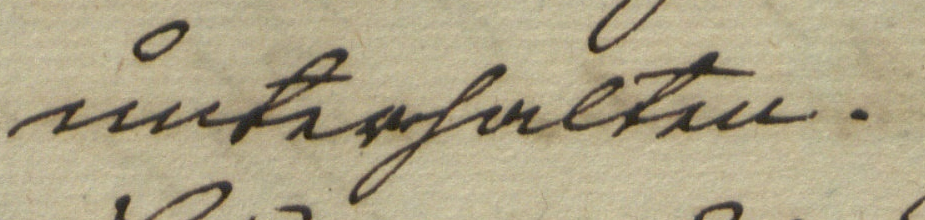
unterhalten.
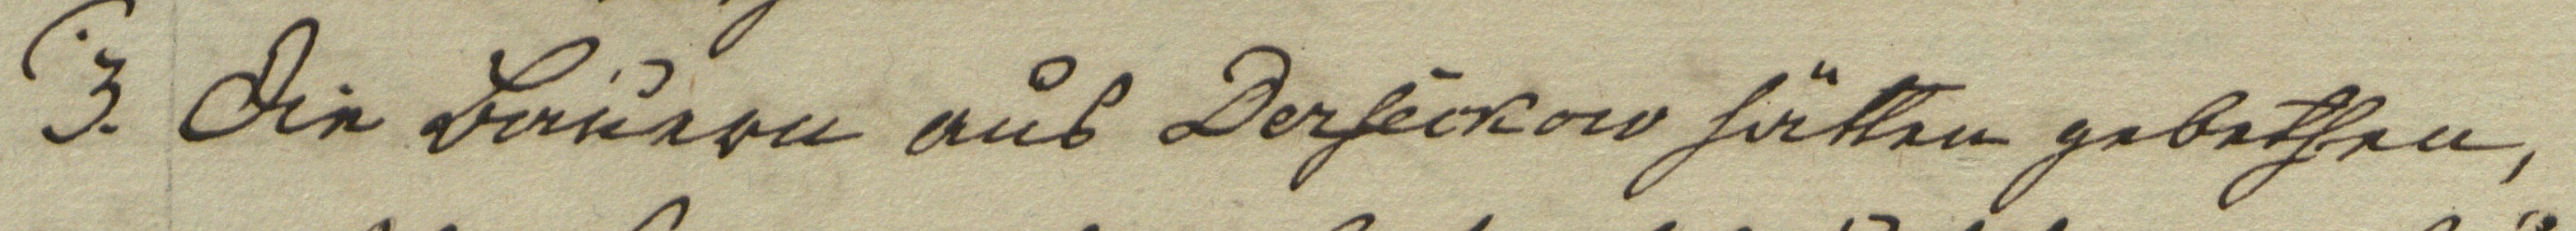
3. Die Bauern aus Derseckow hätten gebethen,
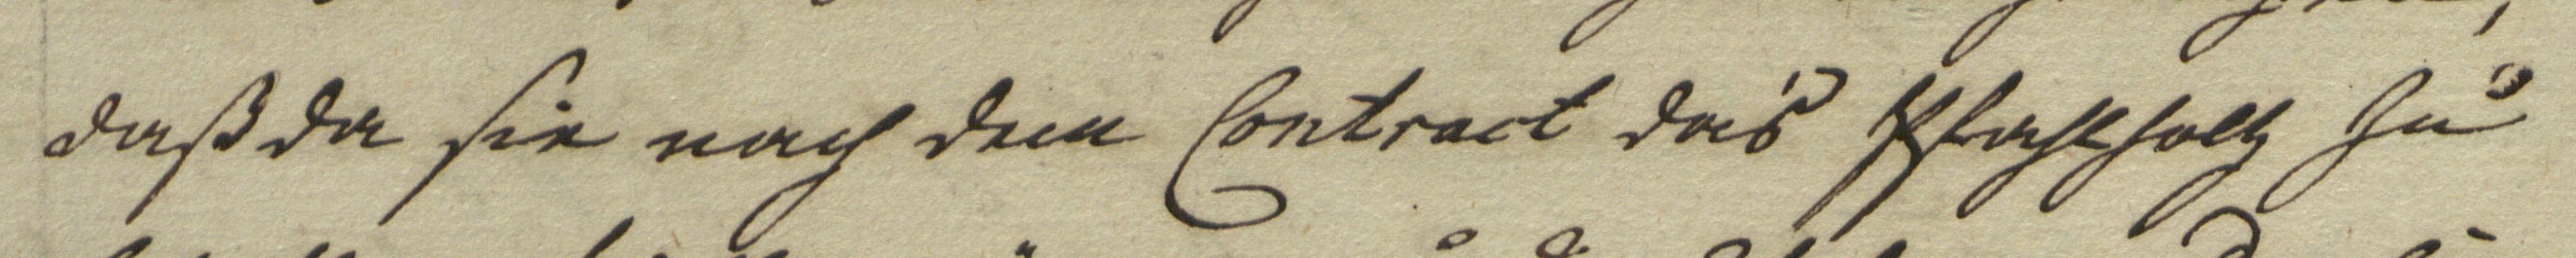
daß da sie nach dem Contract das Pfahlholz zu
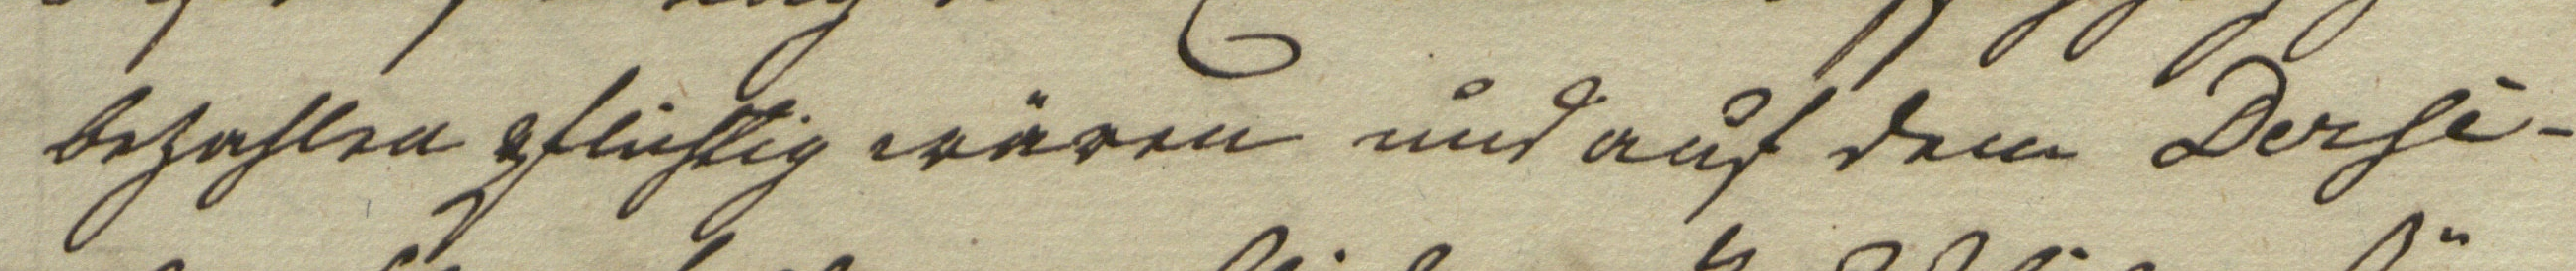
bezahlen pflichtig wären und auf dem Derse¬
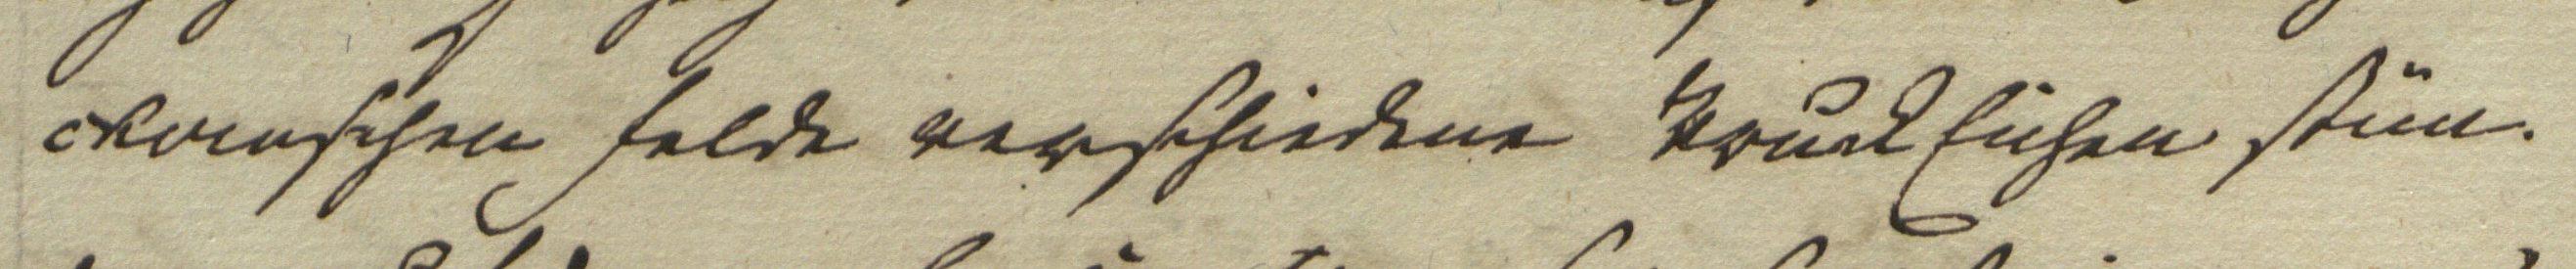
ckowschen Felde verschiedene Wruck Eichen stün-
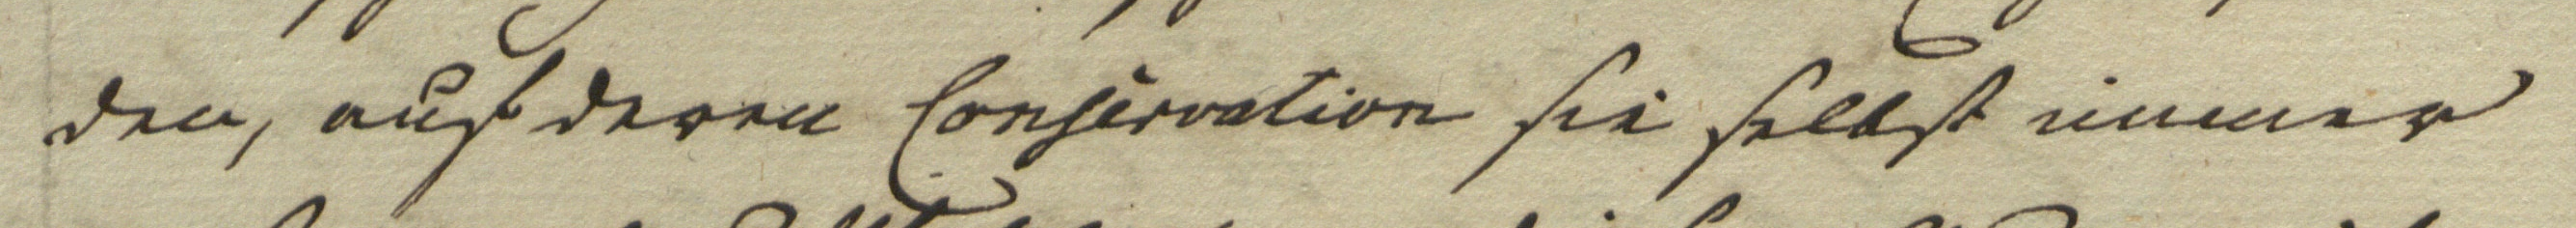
den, auf deren Conservation sie selbst immer
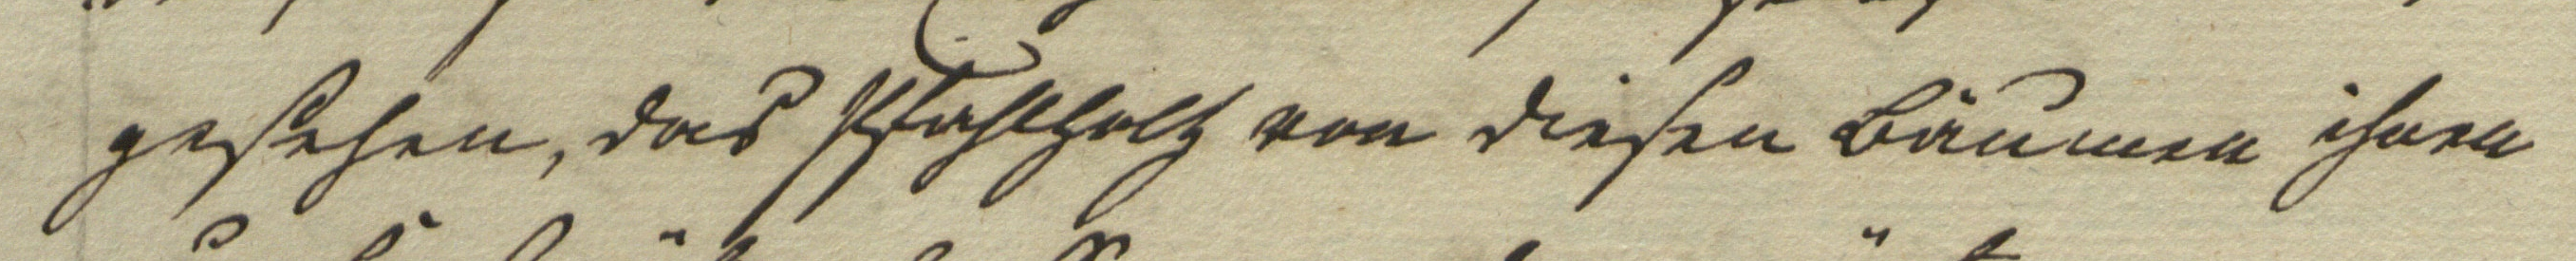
gesehen, das Pfahlholz von diesen Bäumen ihnen
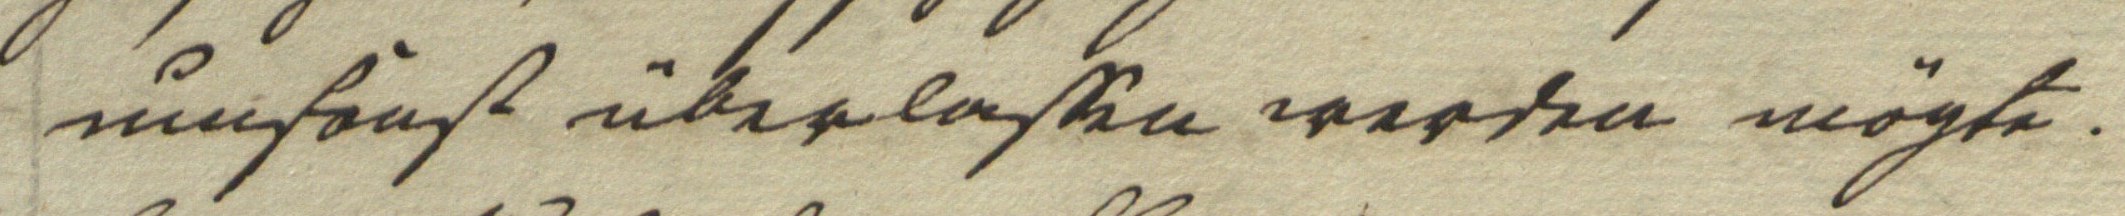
umsonst überlassen werden mögte.
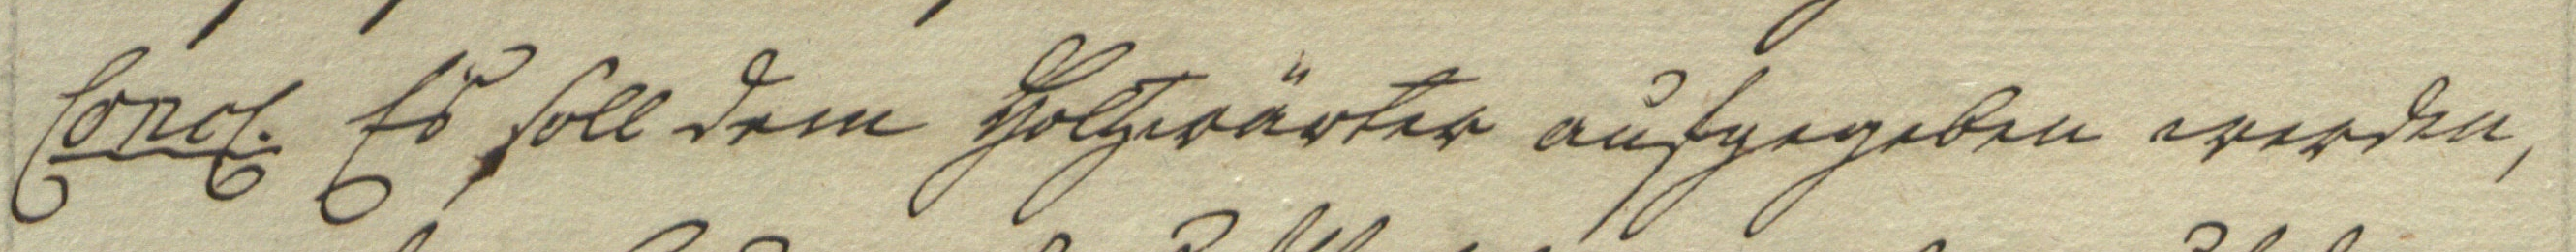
Concl. Es soll dem Holzwärter aufgegeben werden,
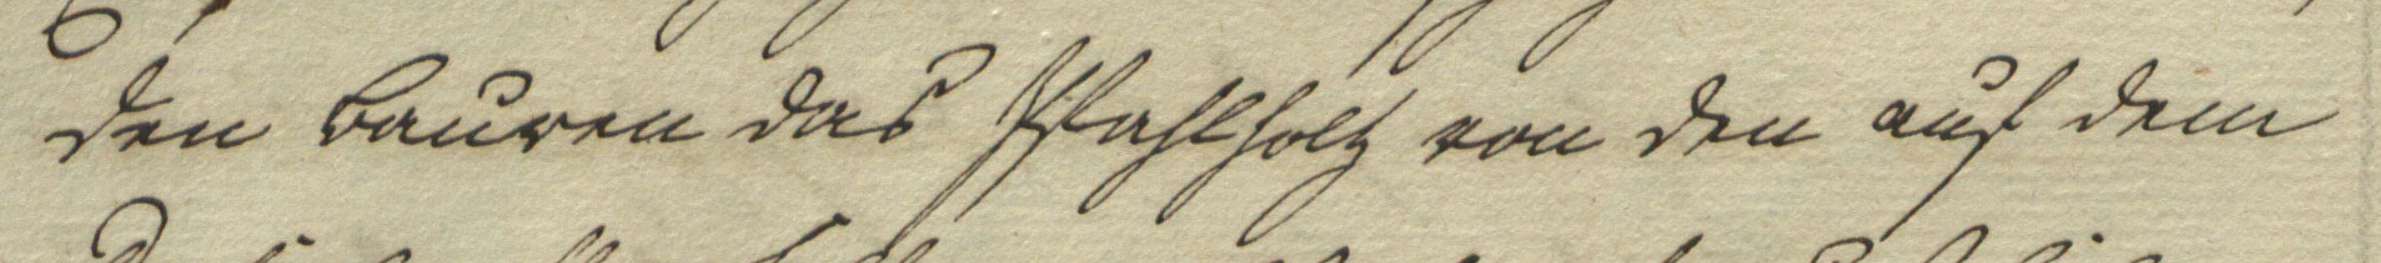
den Bauren das Pfahlholz von den auf dem
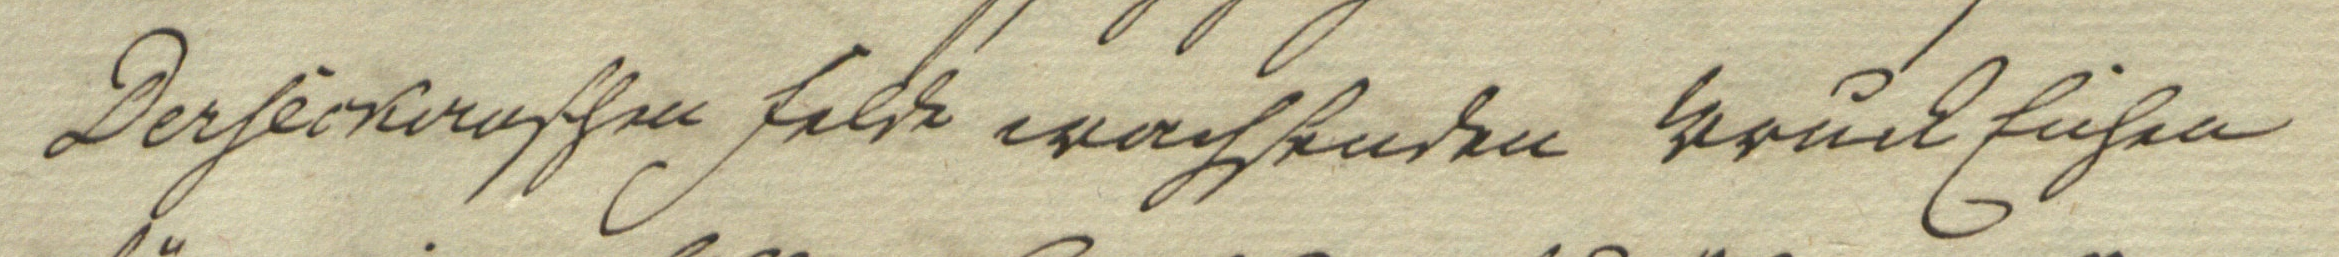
Derseckowschen Felde wachsenden WruckEichen
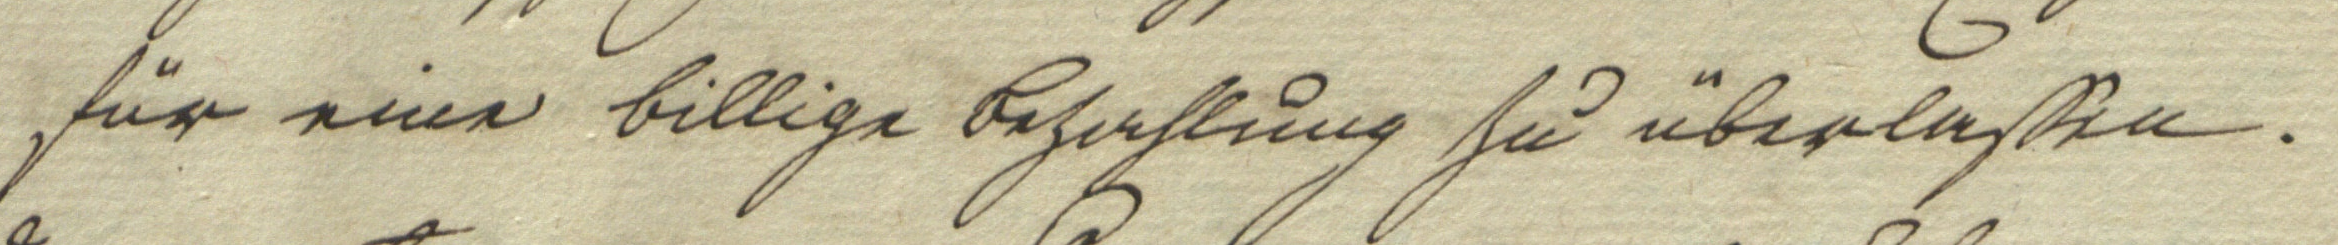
er eine billige Bezahlung zu überlassen.
